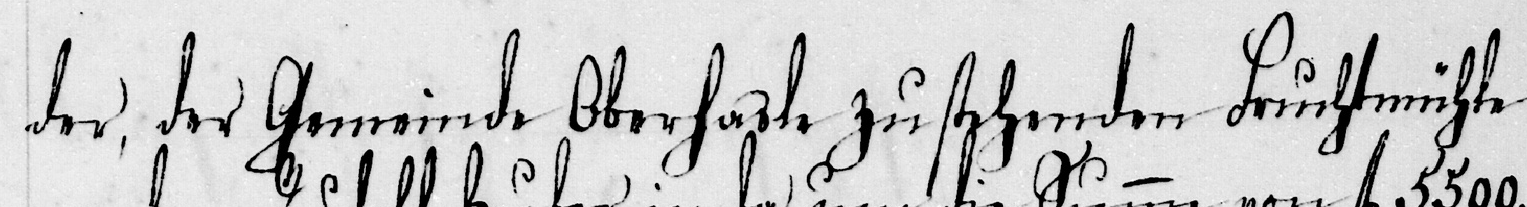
der, der Gemeinde Oberhasle zustehenden Fruchtmühle
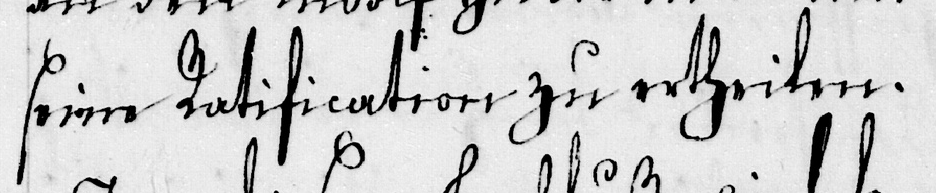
seine Ratification zu ertheilen.
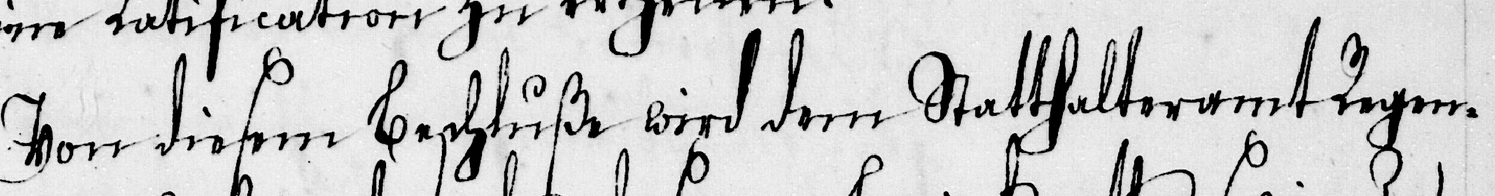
Von diesem Beschluße wird dem Statthalteramt Regen¬
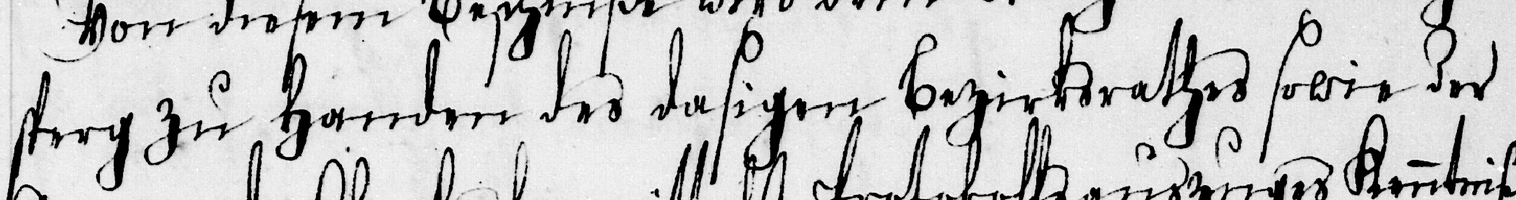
sperg zu Handen des dasigen Bezirksrathes sowie der
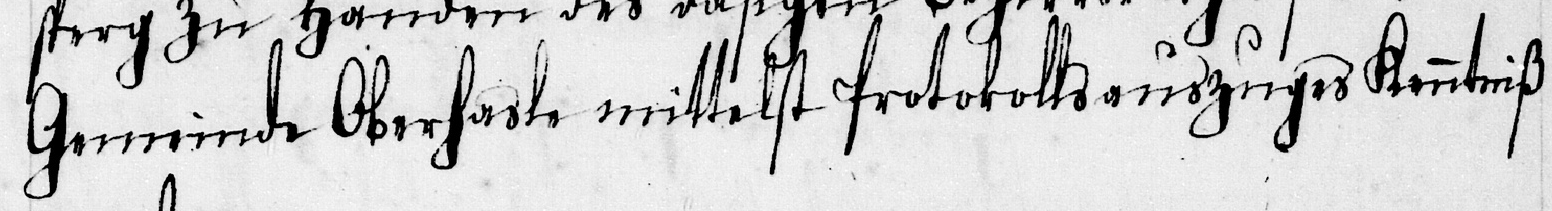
Gemeinde Oberhasle mittelst Protokollsauszuges Kenntniß
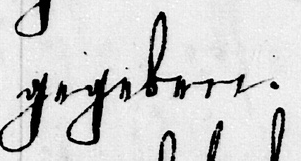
gegeben.
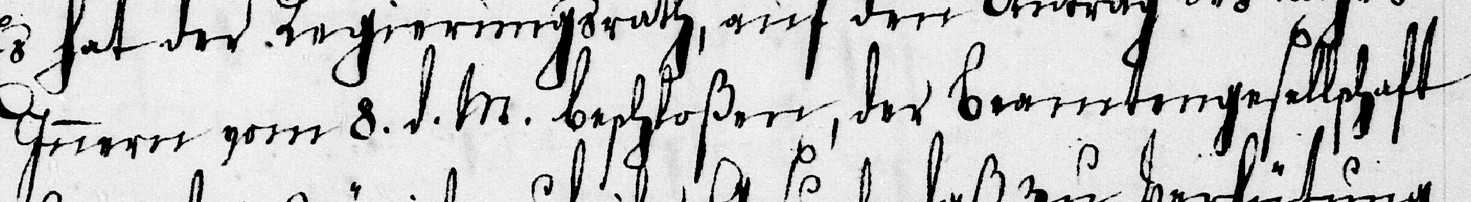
Innern vom 8. d. M. beschloßen, der Beamtengesellschaft
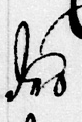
des
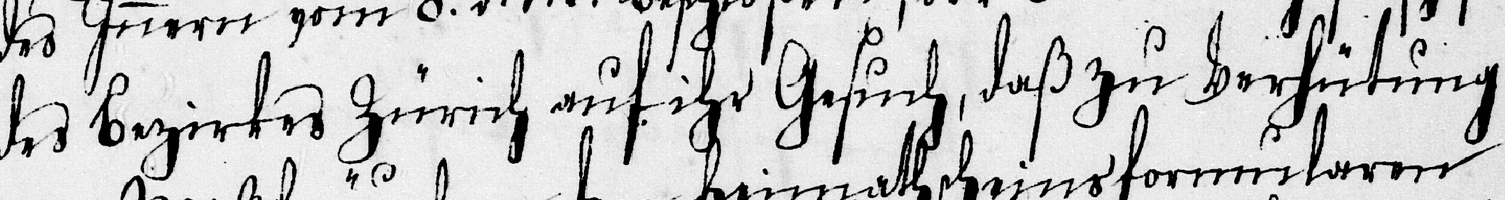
des Bezirkes Zürich auf ihr Gesuch, daß zu Verhütung
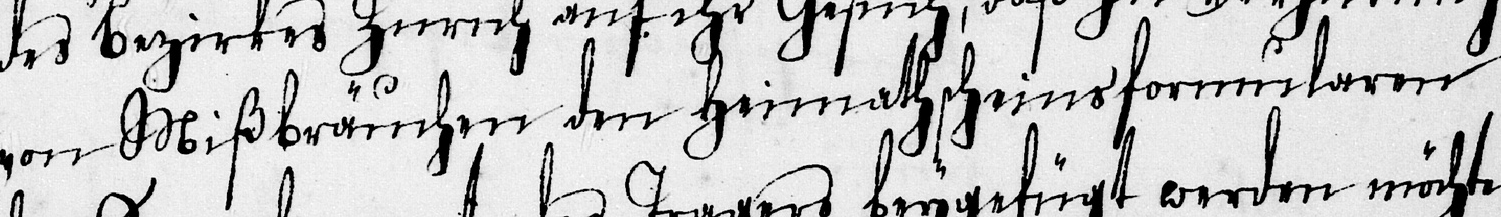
von Mißbräuchen den Heimathscheinsformularen
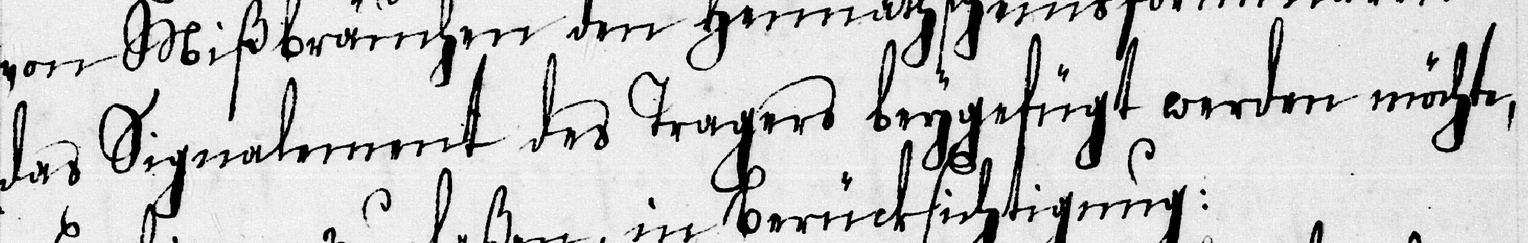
das Signalement des Tragers beygefügt werden möchte,
